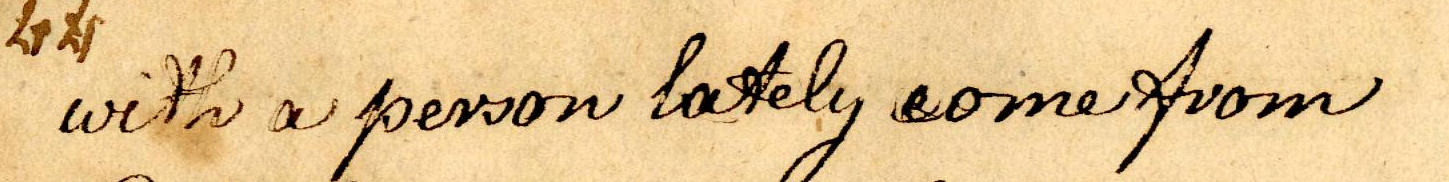with a person lately come from
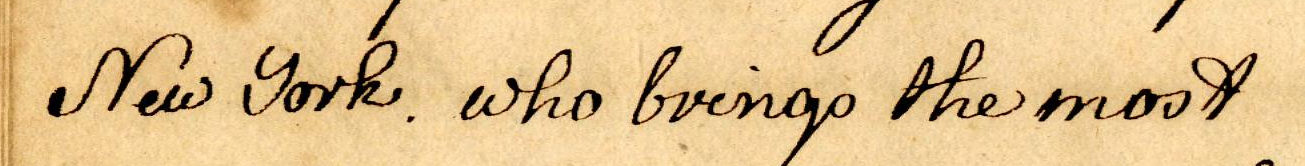New York who brings the most
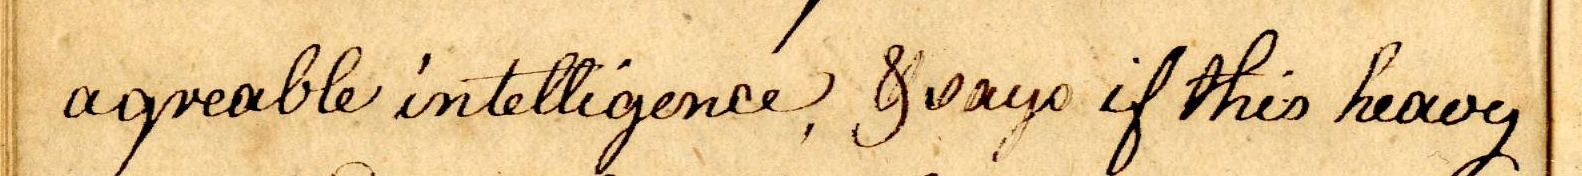agreable intelligence, & says if this heavy
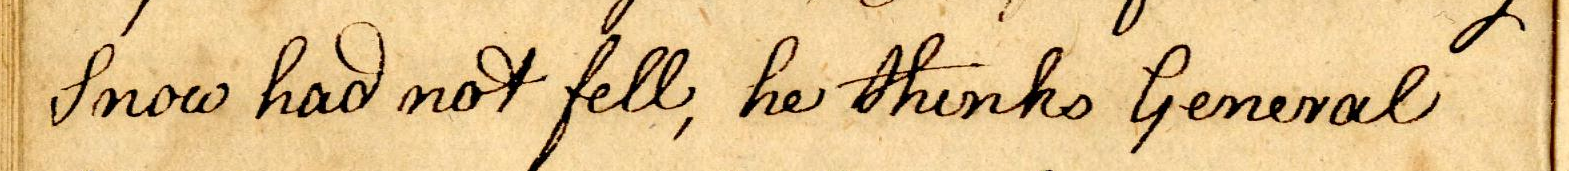Snow had not fell, he thinks General
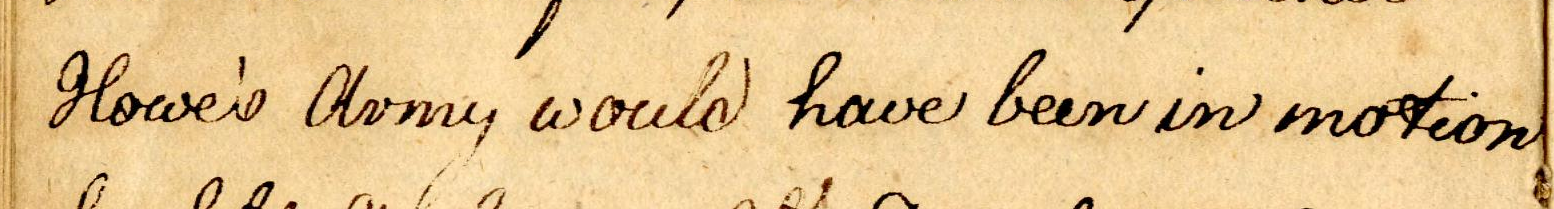Howe's Army would have been in motion
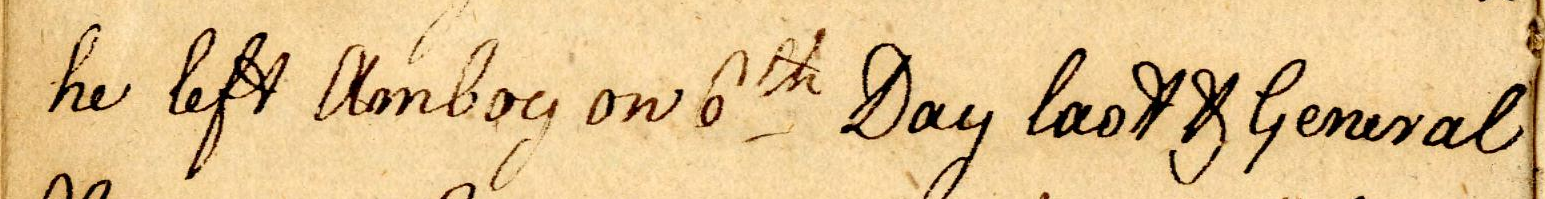he left Amboy on 6^th Day last & General
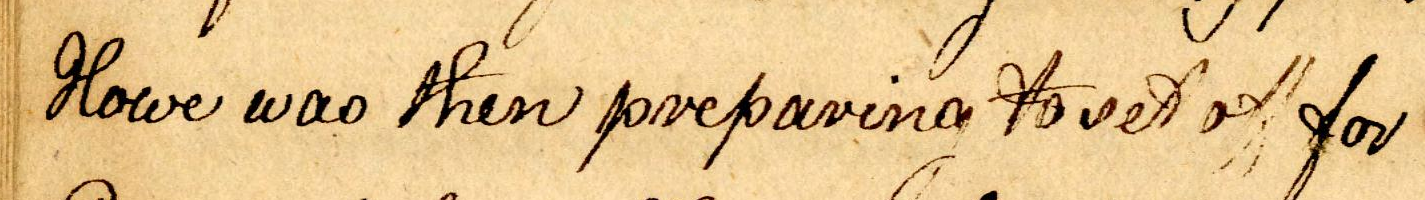Howe was then preparing to set off for
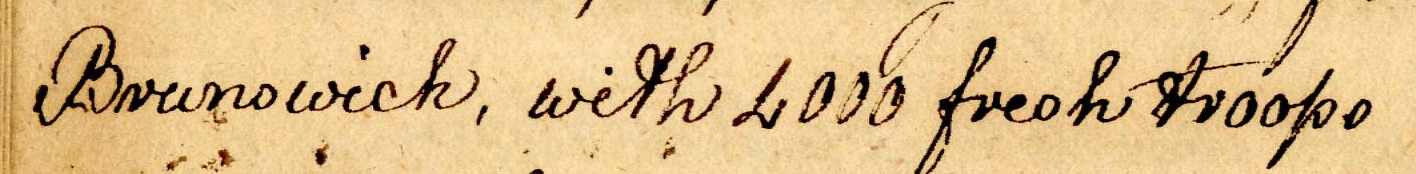Brunswick, with 4000 fresh troops
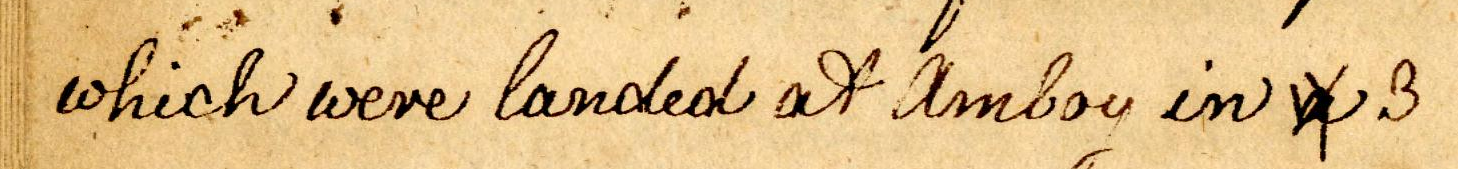which were landed at Amboy in [a] 3
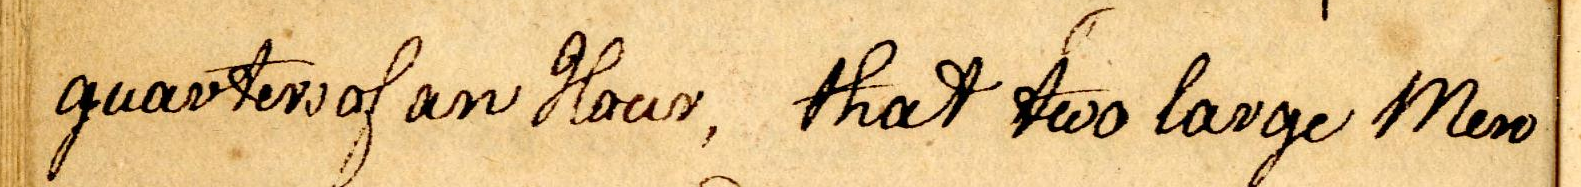quarters of an Hour, that two large Men
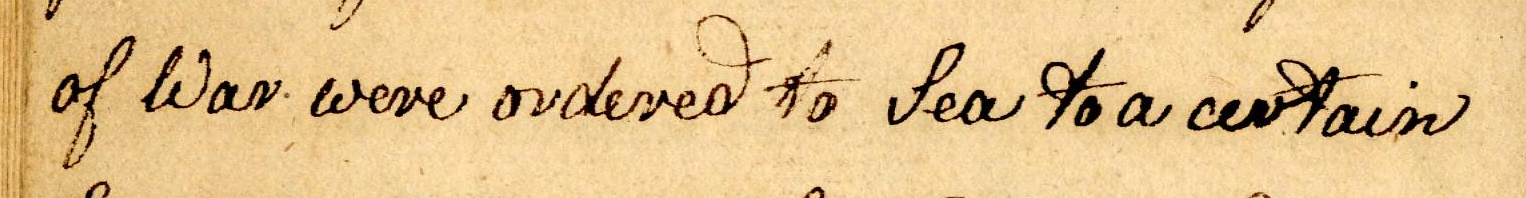of War were ordered to Sea to a certain
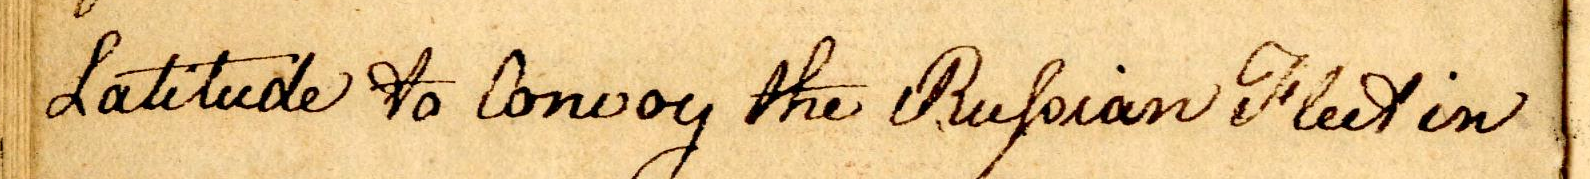Latitude to Convoy the Russian Fleet in
